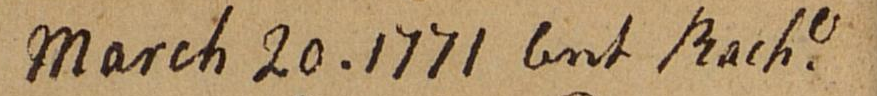March 20. 1771 [bnt] Rach^l.
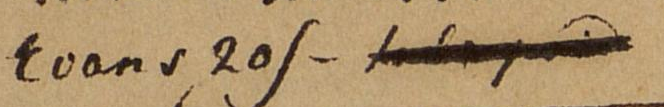Evans 20 [_] - [take paid]
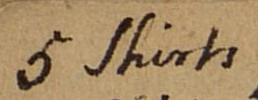5 Shirts
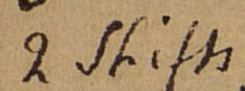2 Shifts
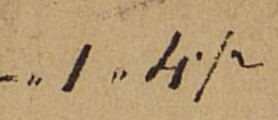.. 1 .. 4 1/2
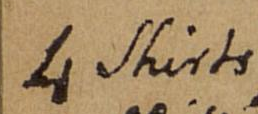4 Shirts
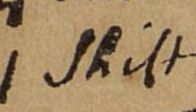1 Shift
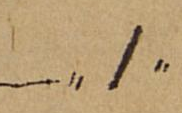- .. 1 ..
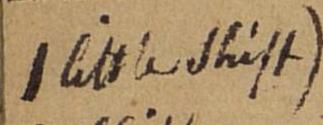1 little Shift
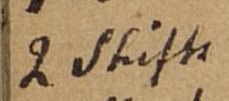2 Shifts
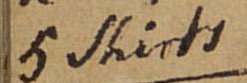5 Shirts
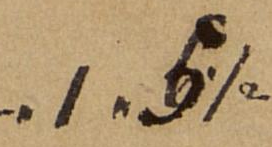-.1.5 1/2
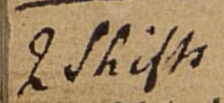2 Shifts
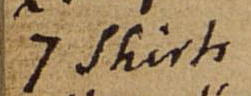7 Shirts
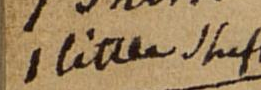1 little Shift
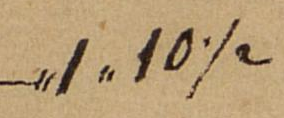- ..1..10 1/2
